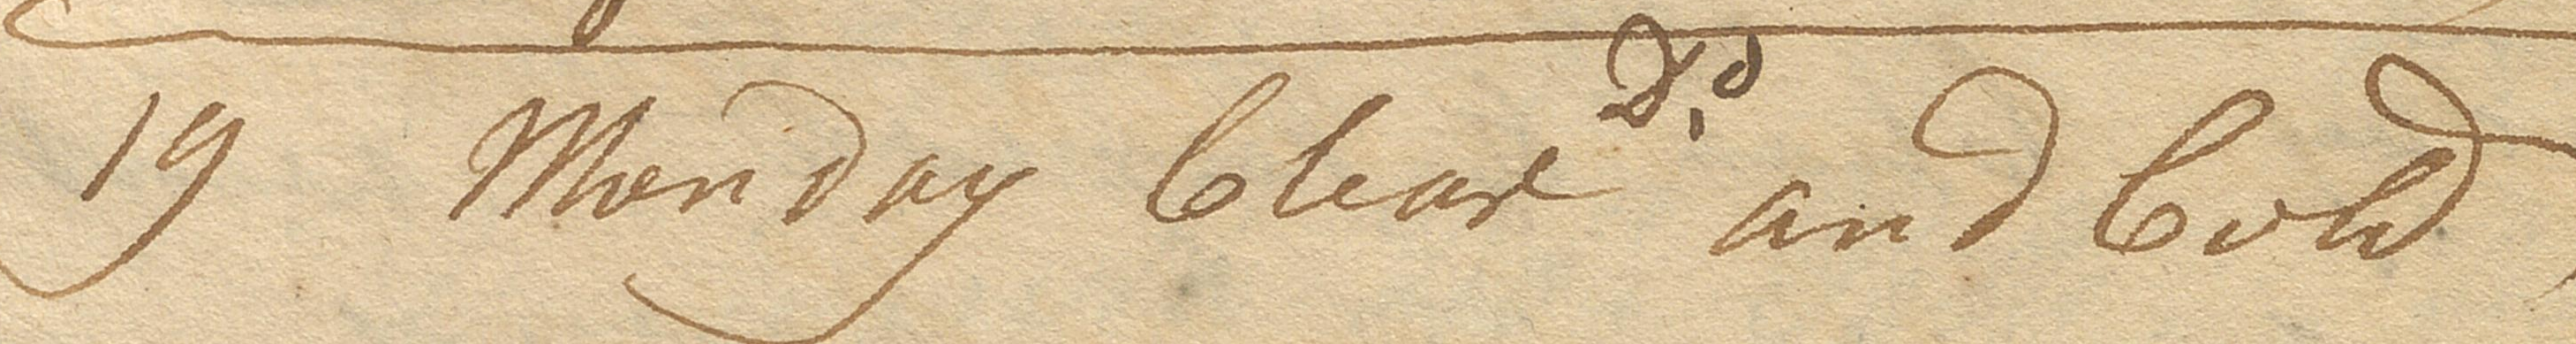19 Monday Clear and Cold
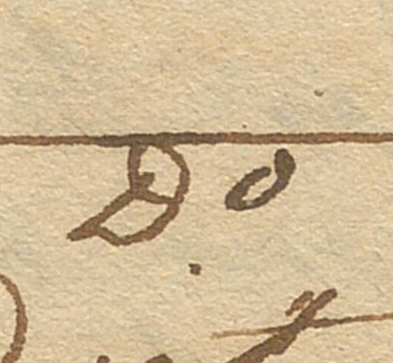D^o
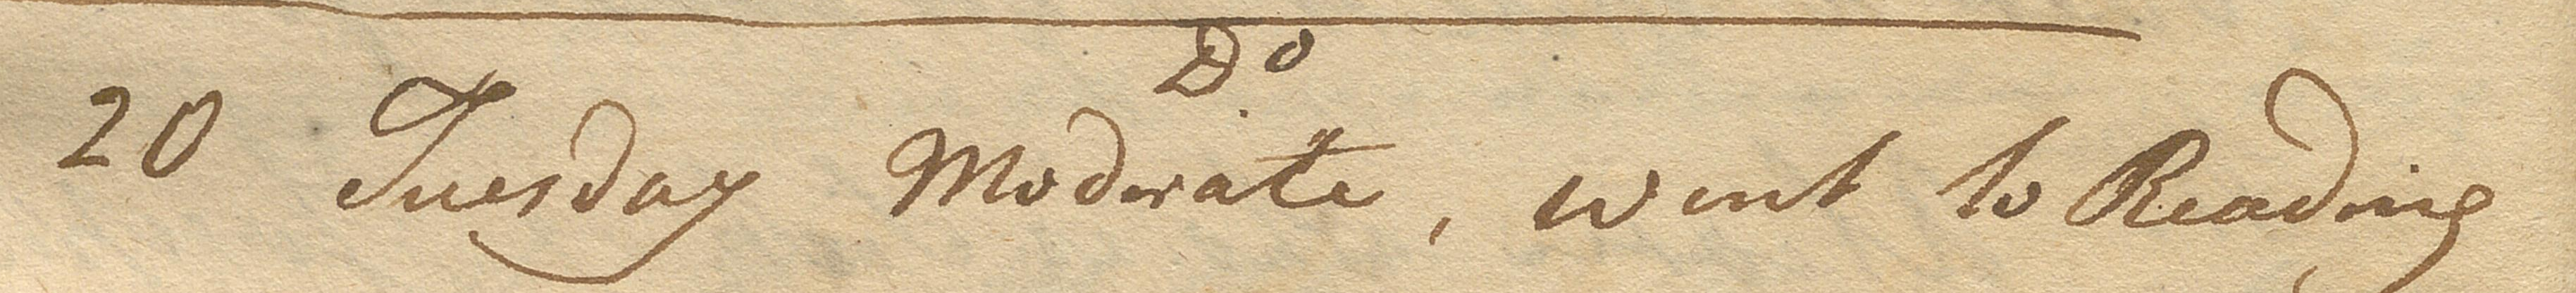20 Tuesday Moderate, went to Reading
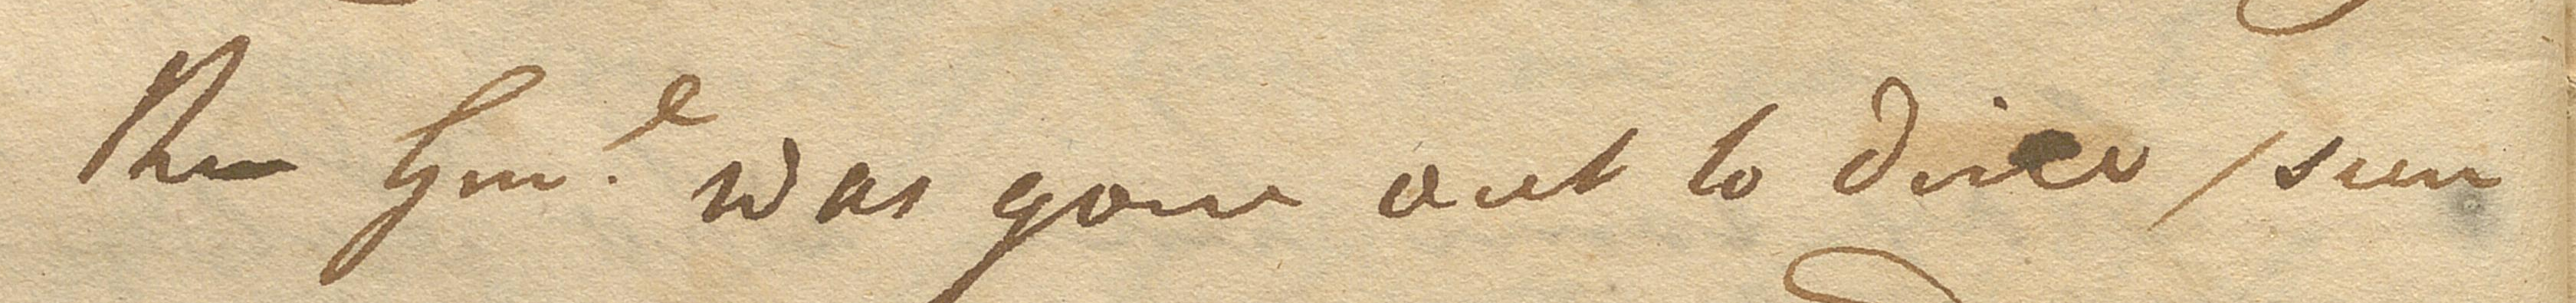the Gen^l. was gone out to diner / seen
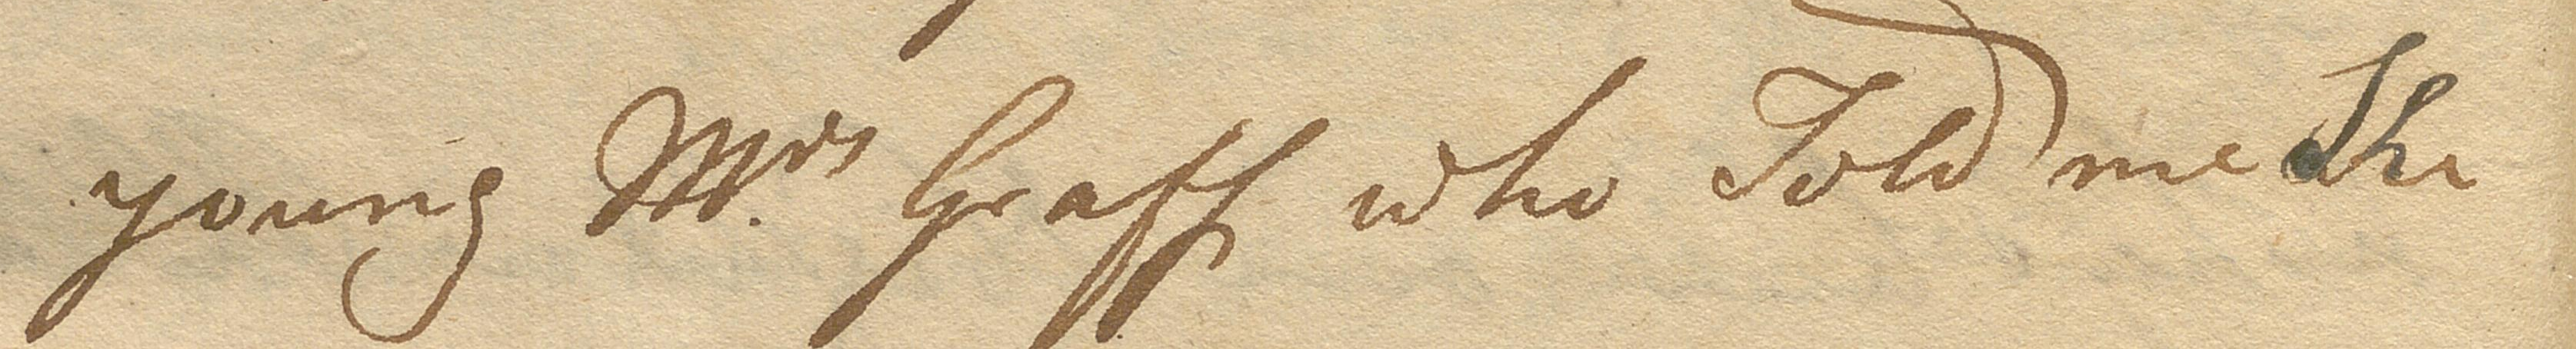young M^rs. Graff who Told me she
